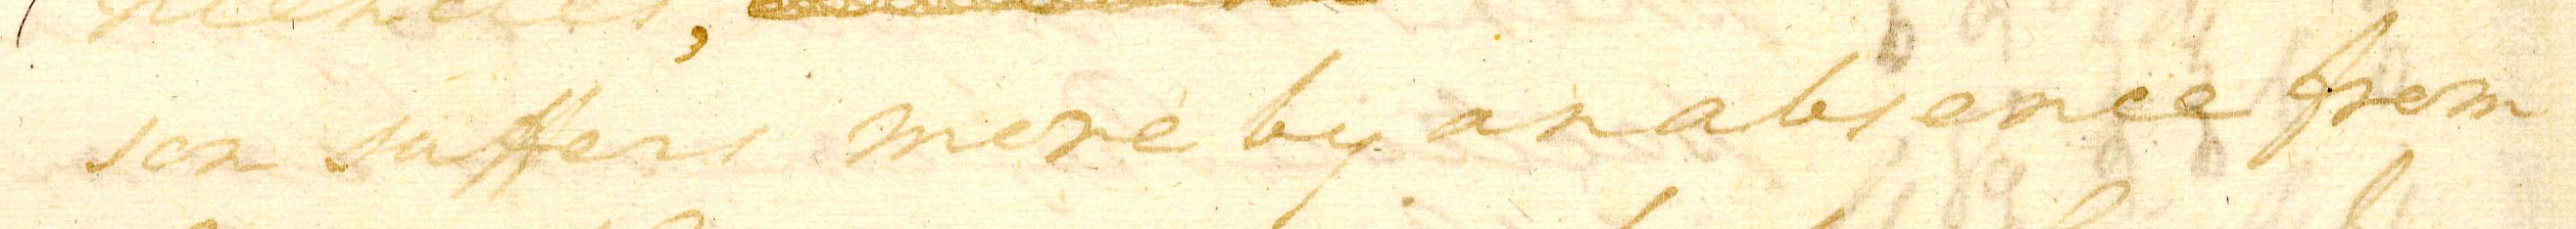son suffers more by an absence from
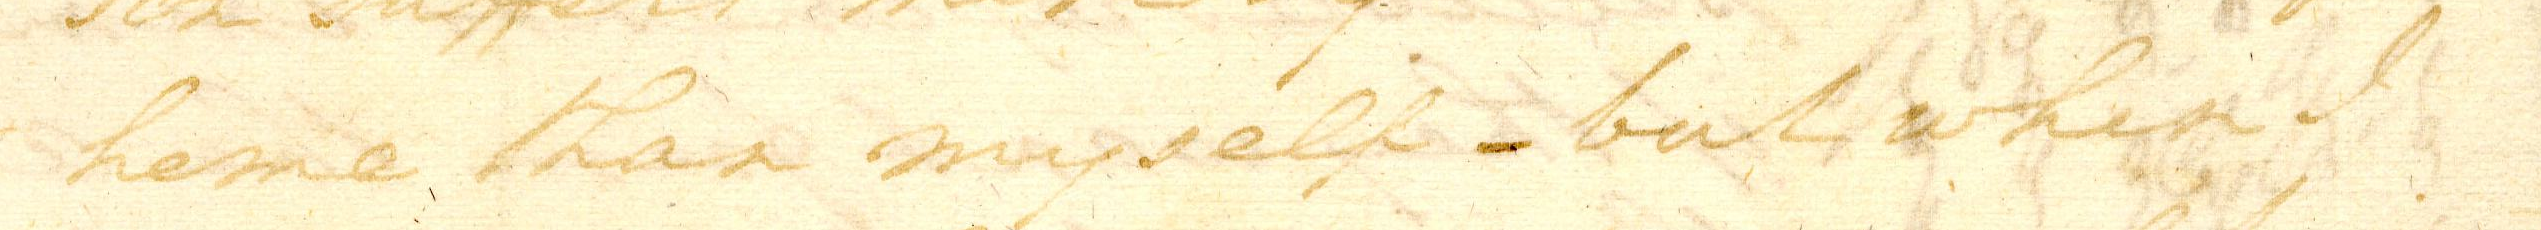home than myself- but when I
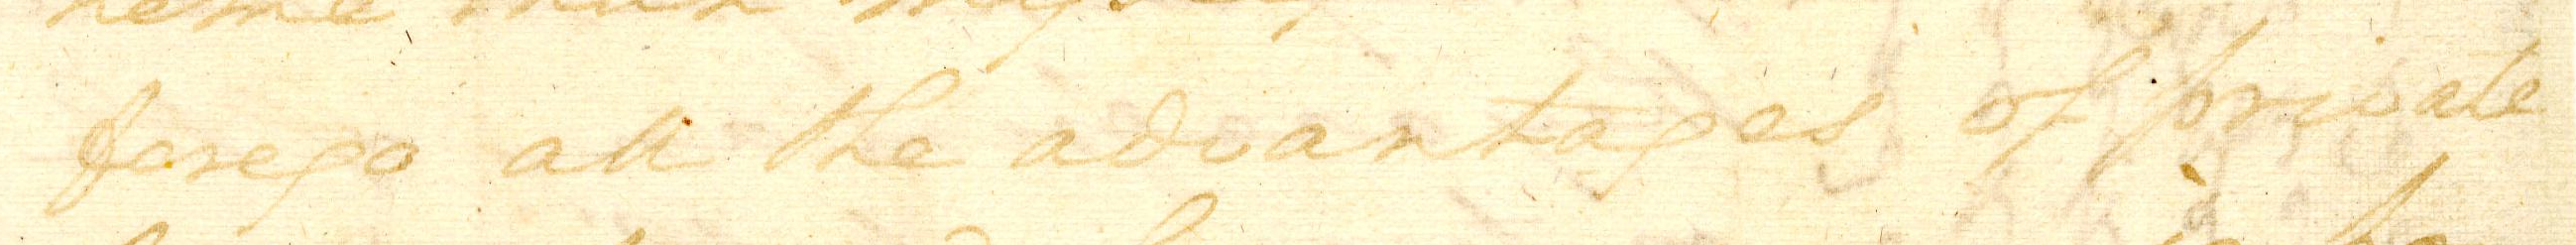forego all the advantages of private
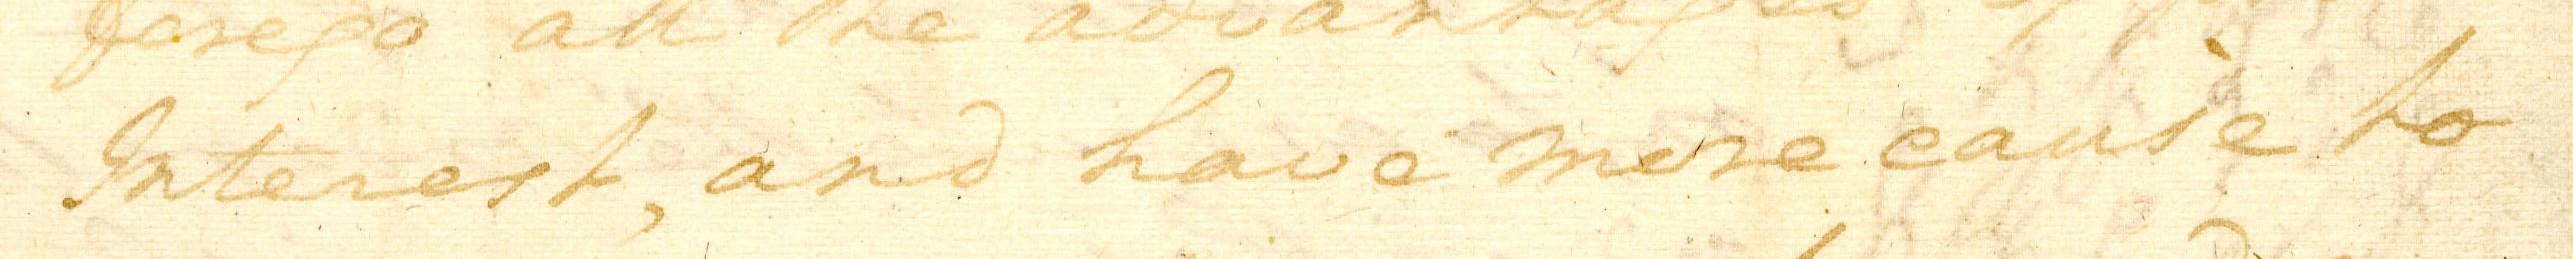Interest, and have more cause to
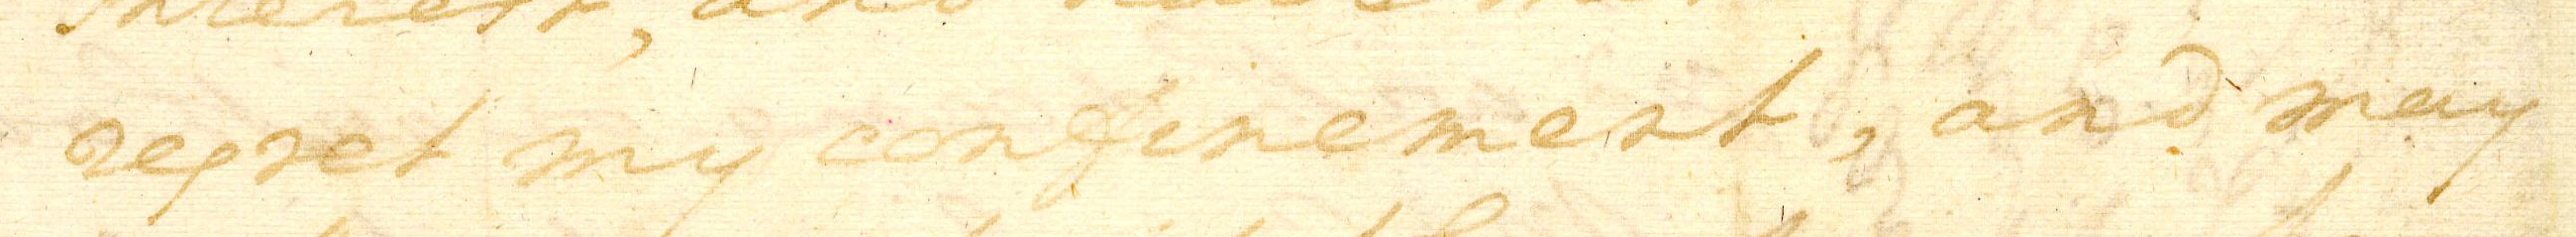regret my confinement, and may
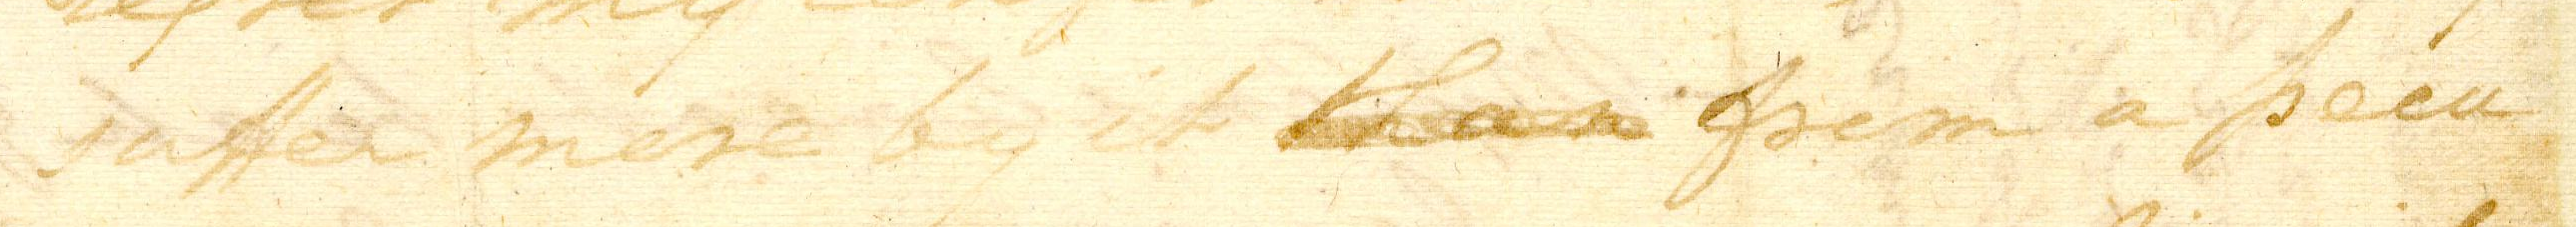suffer more by it [____] from a pecu
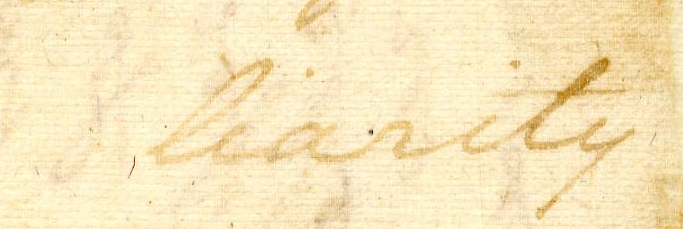liarity
